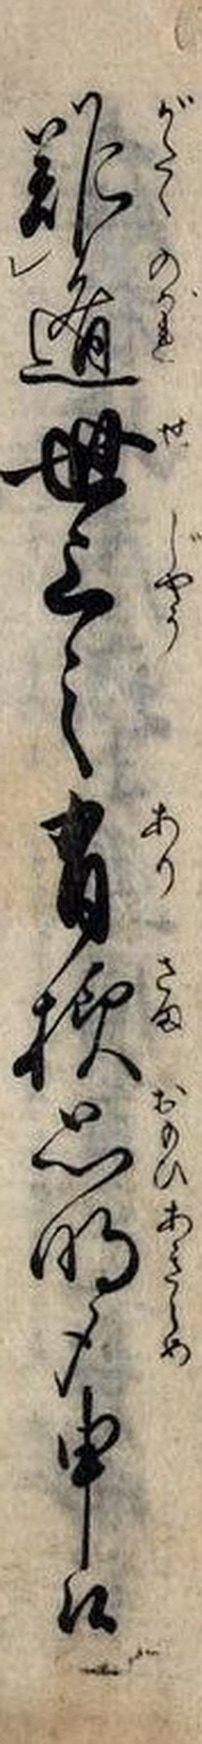難遁世上之有様思明〆申候
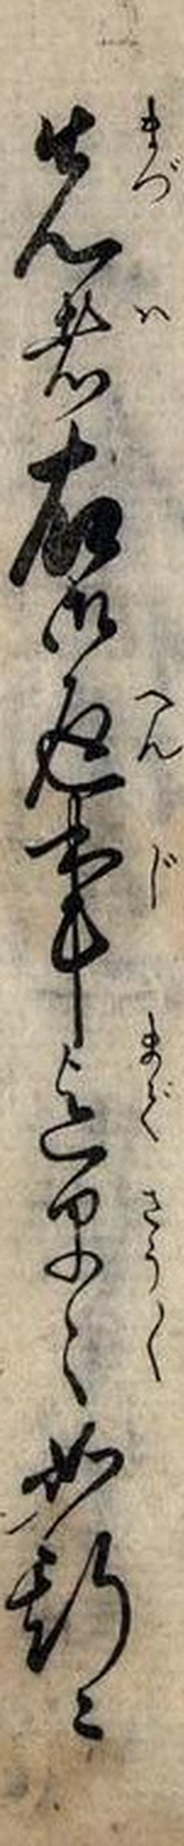先者右御返事迄早々如斯に
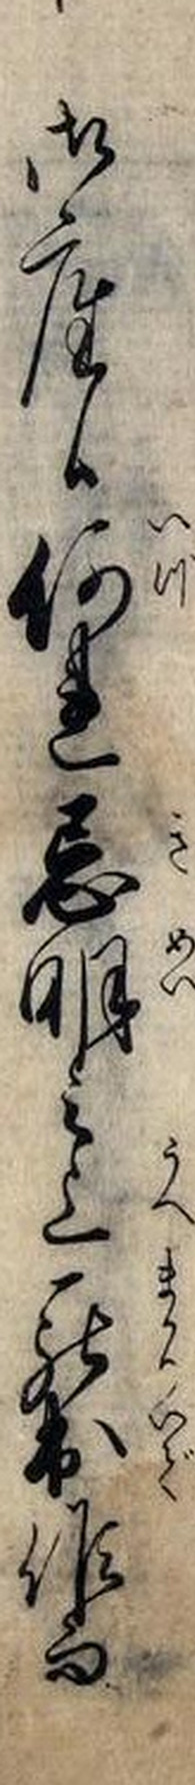御座候何れ忌明之上罷出候而

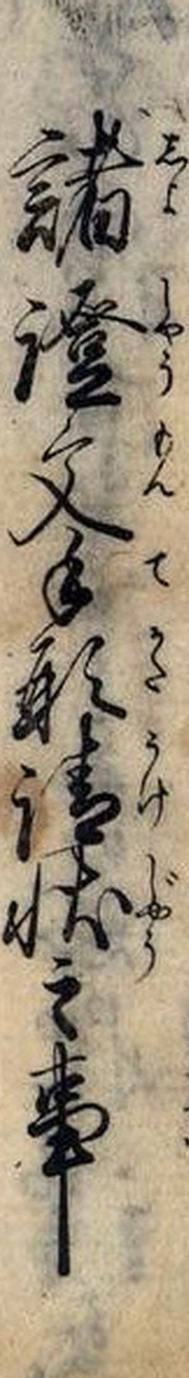諸證文手形請状之事
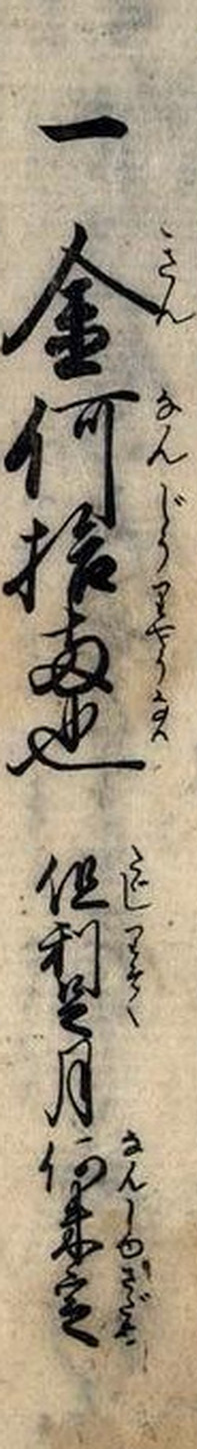一金何拾両也但利足月何朱定
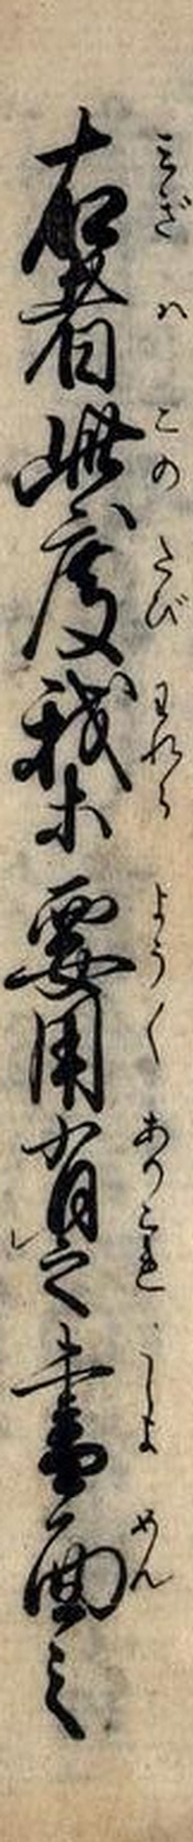右者此度我等要用有之書面之
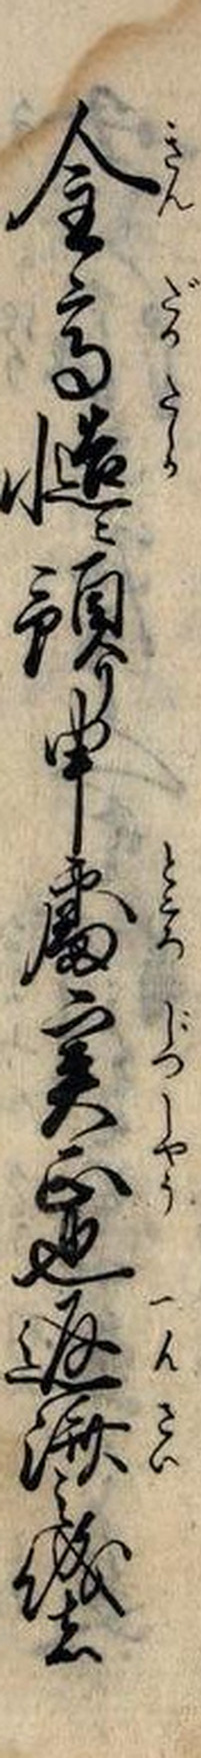金高慥に預り申處実正也返済之儀者
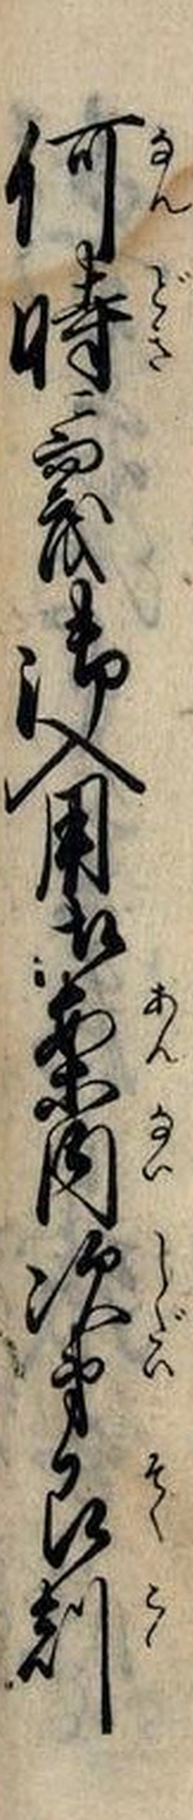何時に而も御入用御案内次第即刻
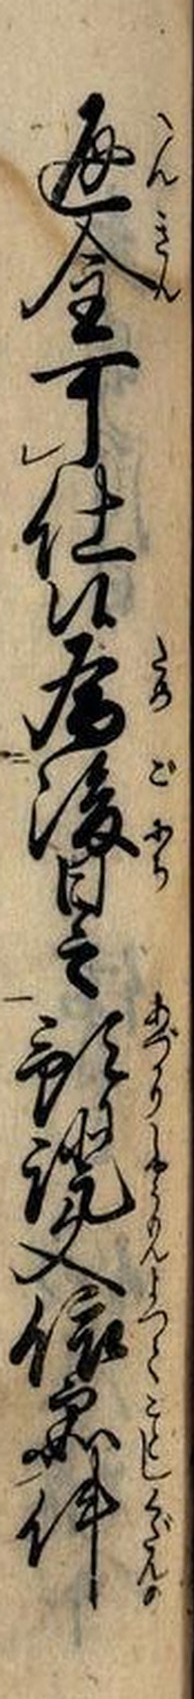返金可仕候為後日之預證文依如件
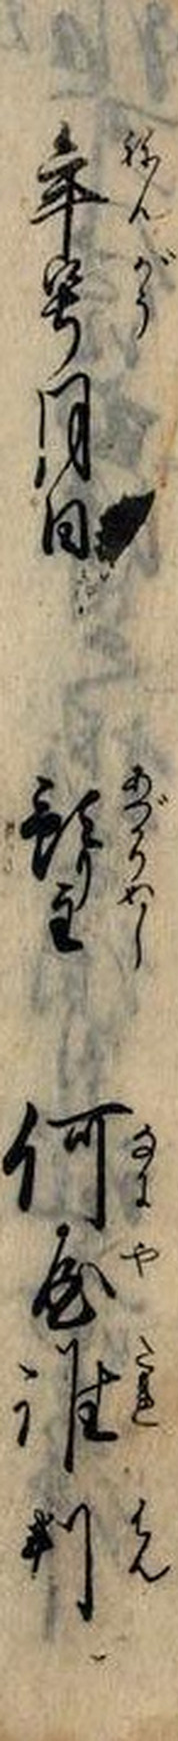年号月日預主何屋誰判
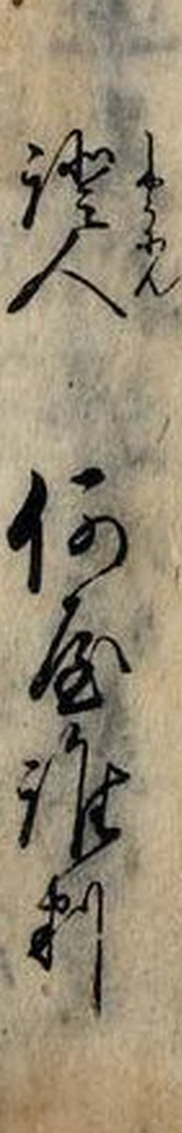證人何屋誰判
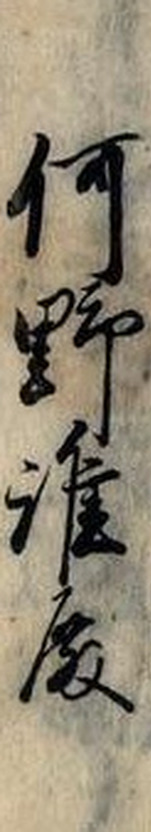何野誰殿
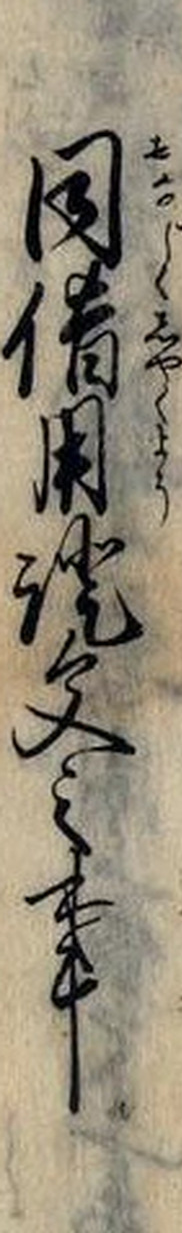同借用證文之事
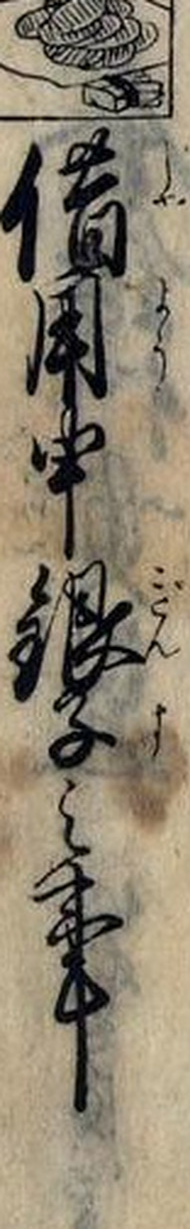借用申銀子之事

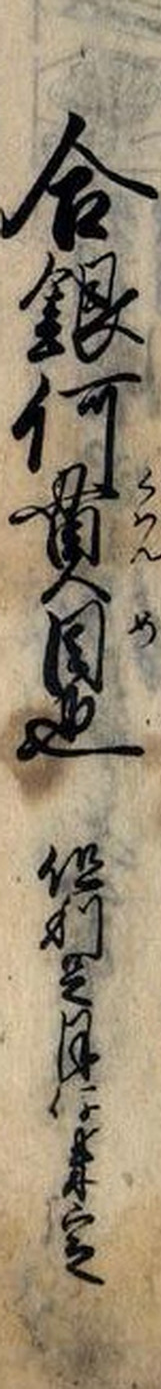合銀何貫目也但利足月何朱定
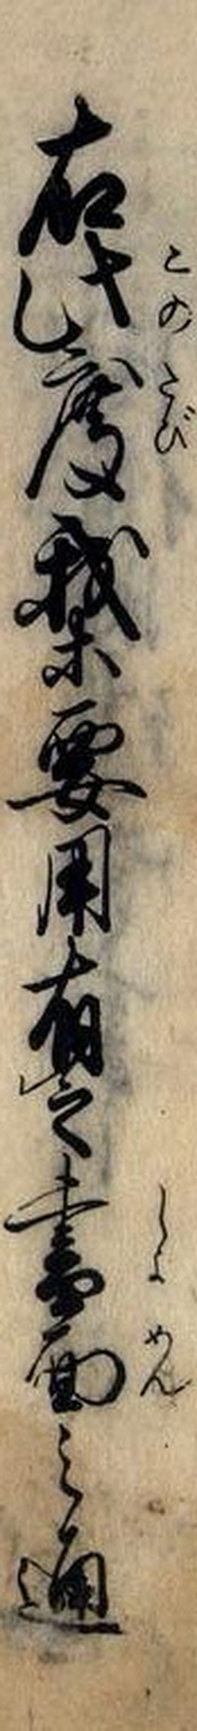右此度我等要用有之書面之通
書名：大成用文章（往来物）
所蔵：福井県文書館 Fukui Prefectural Archives
